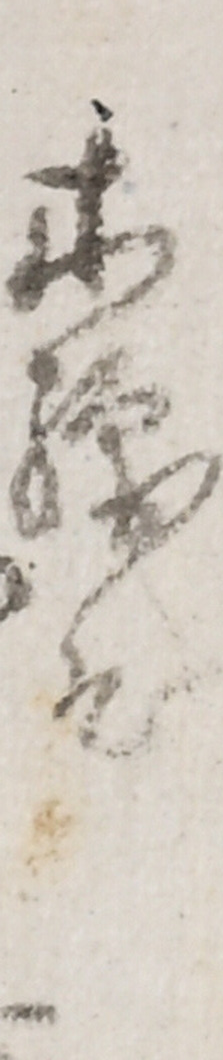木綿屋
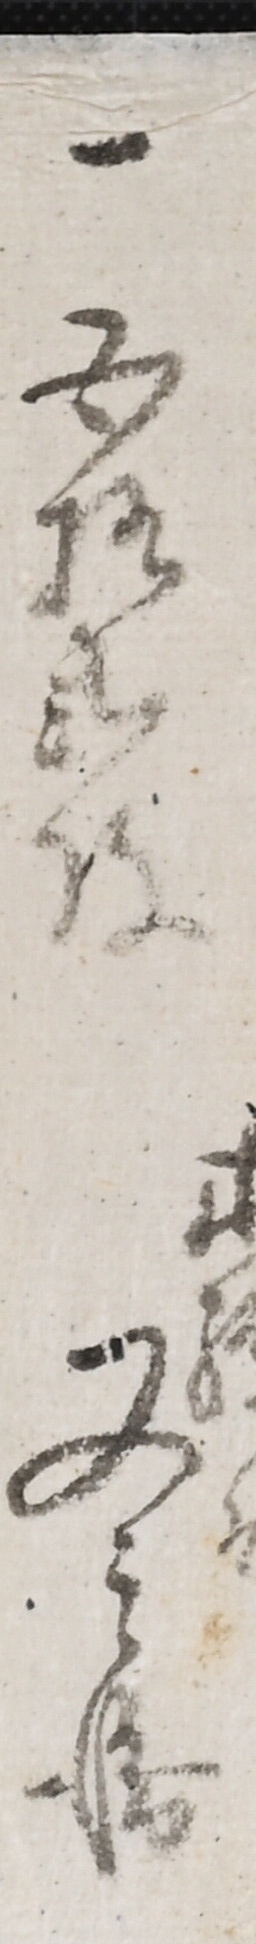一五拾弐枚又兵衛
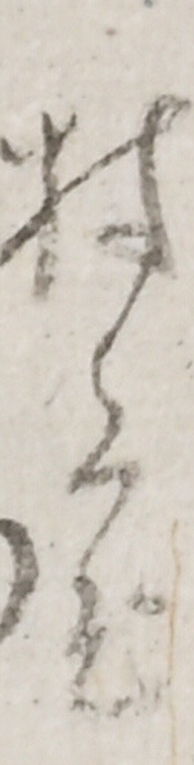村上屋
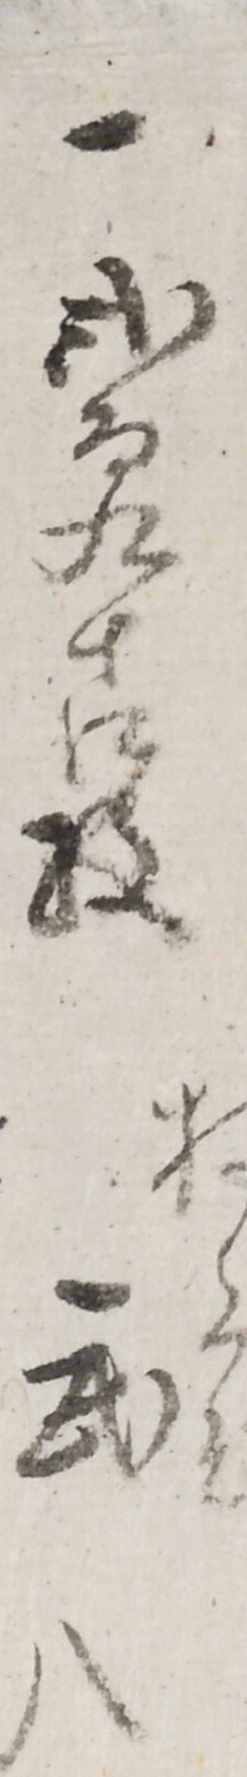一弐百九十四枚武八
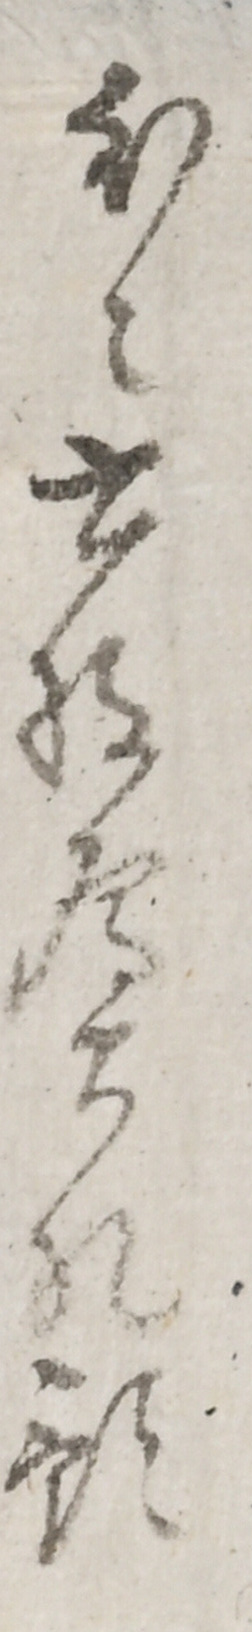外ニ六枚贗札預
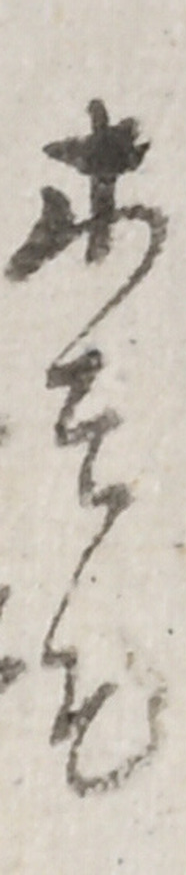木そ屋
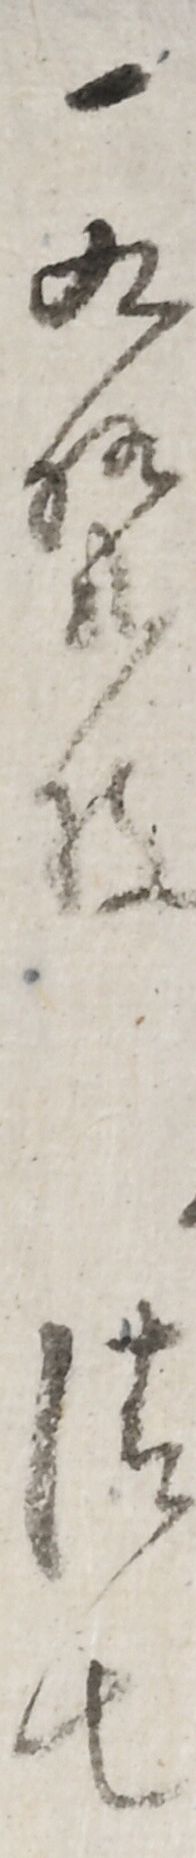一九拾弐枚清七
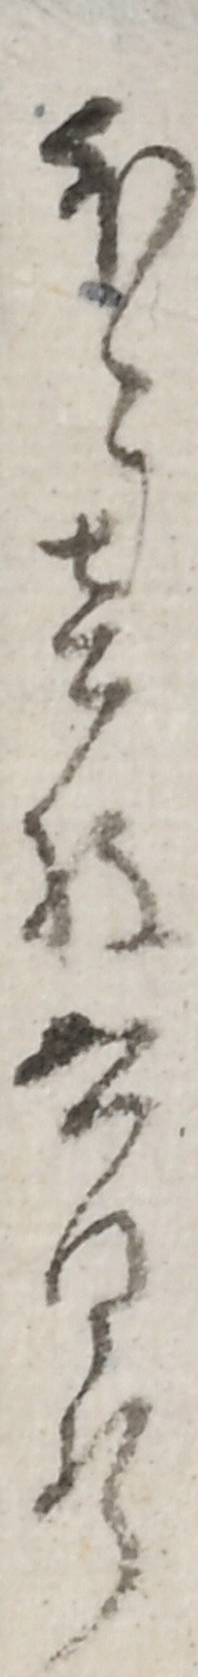外ニ壱枚右同断
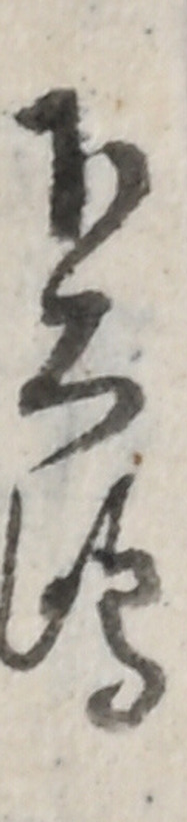下大嶋

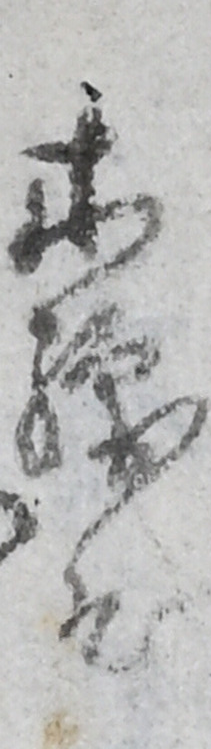木綿屋
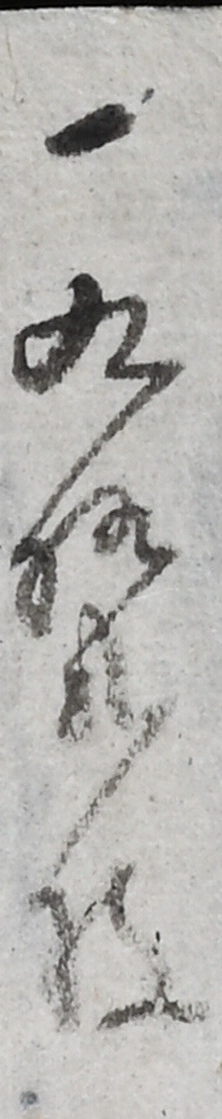一九十九枚
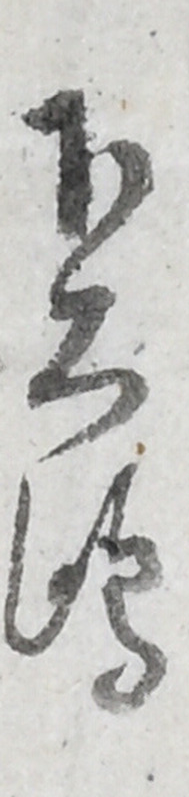下大嶋
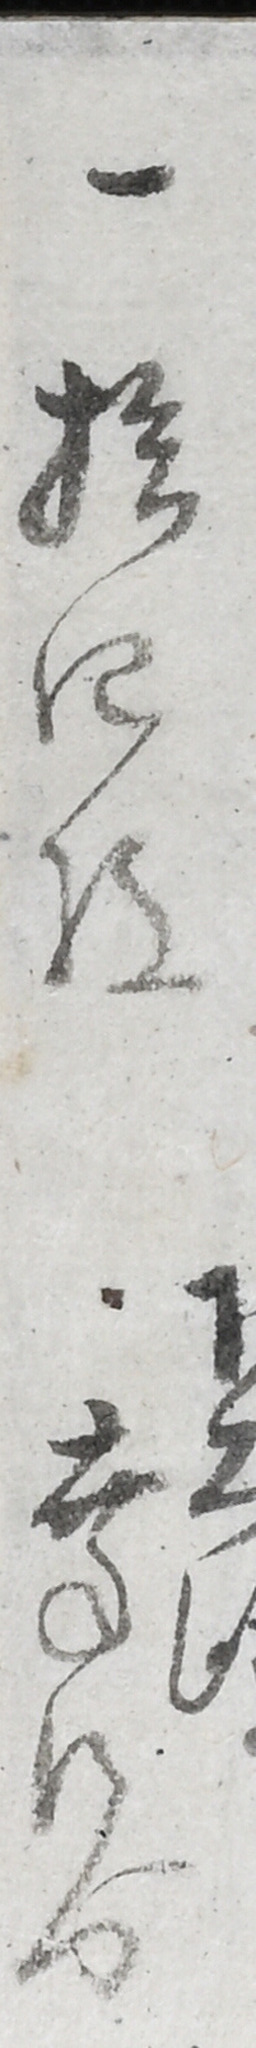一拾四枚幸左衛門
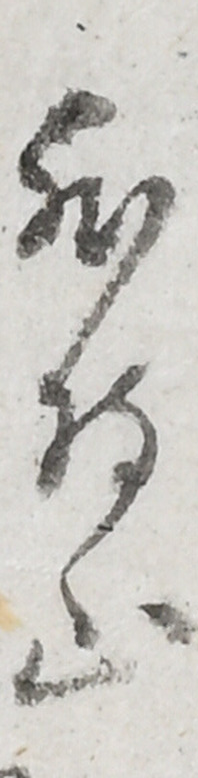非持山
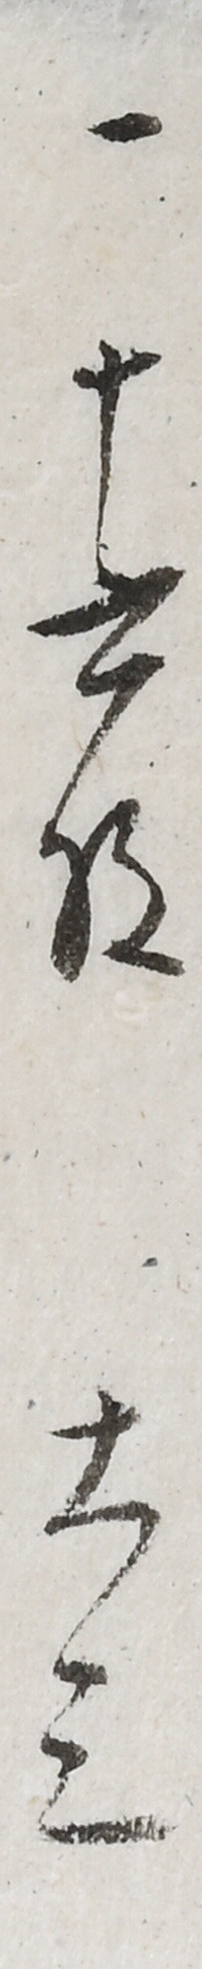一十六枚大三
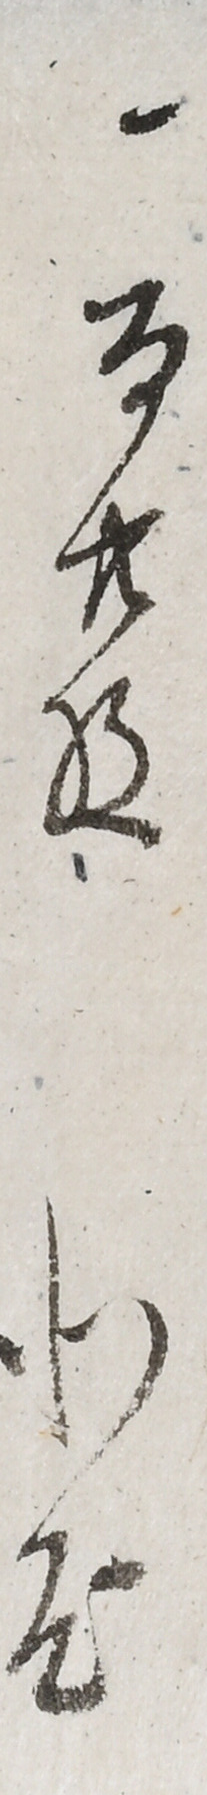一百廿枚北屋
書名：髙遠限楮幣引換覚帳
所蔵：伊那市立高遠町図書館・合同会社AMANE
